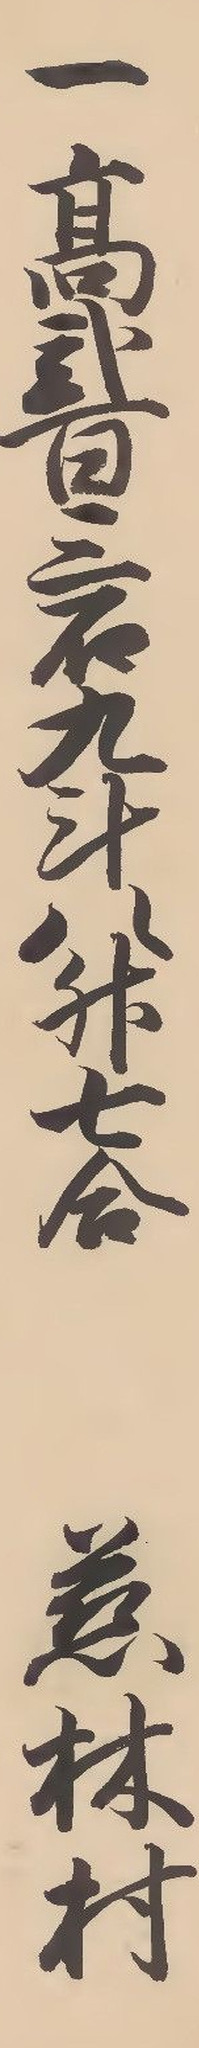一高弐百三石九斗八升七合慈林村
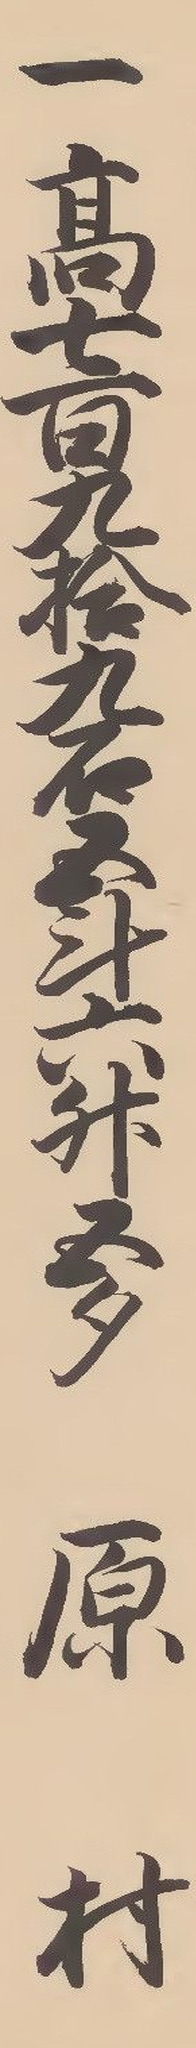一高七百九拾九石五斗六升五勺原村
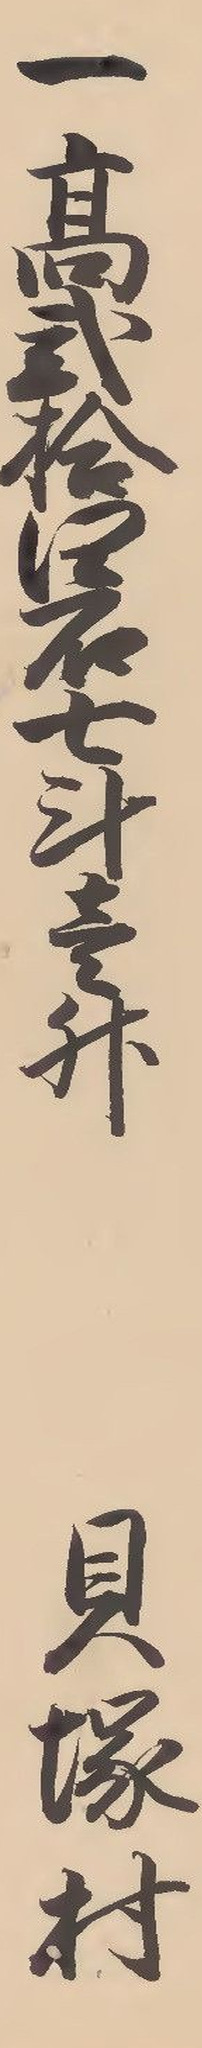一高弐拾四石七斗壱升貝塚村
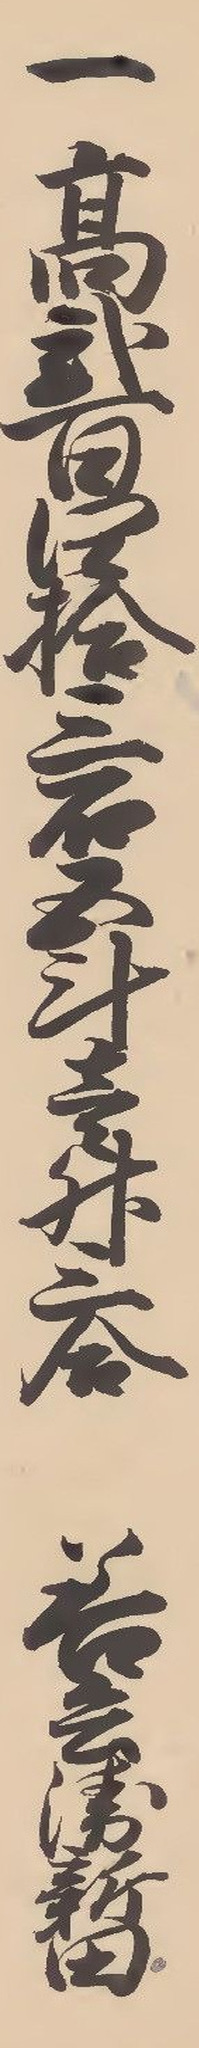一高弐百四拾三石五斗壱升三合善兵衛新田
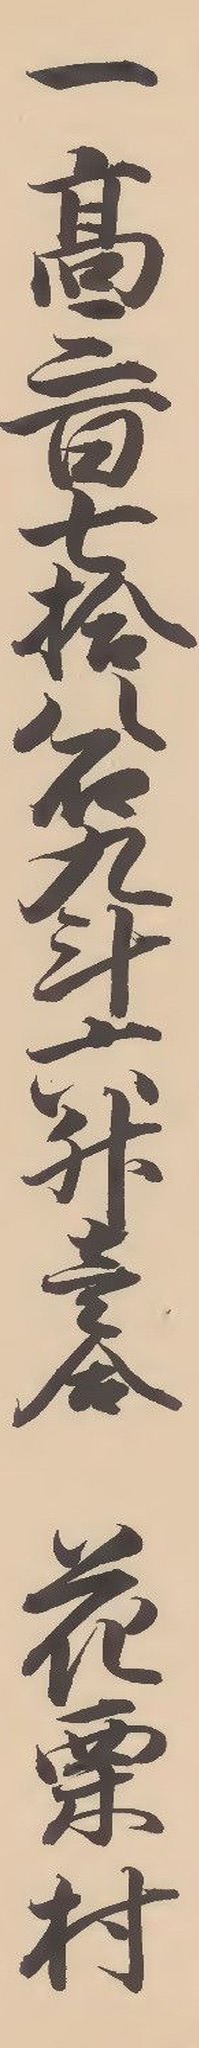一高三百七拾八石九斗六升壱合花栗村
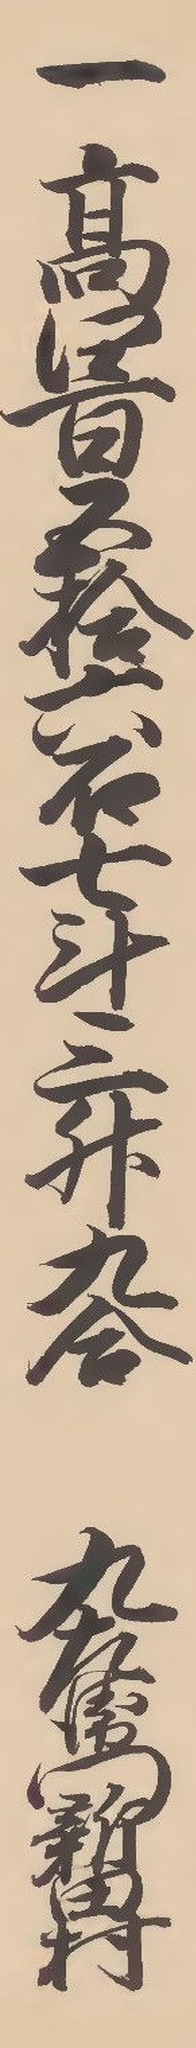一高四百五拾六石七斗三升九合九左衛門新田村
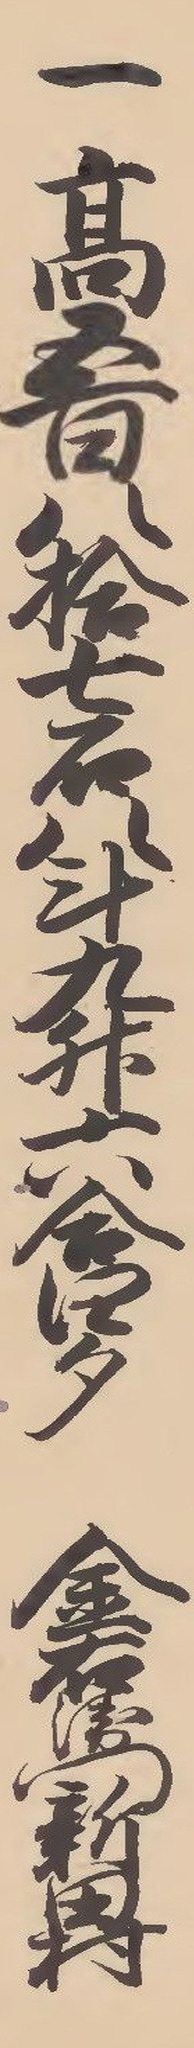一高五百八拾七石八斗九升六合四勺金右衛門新田村

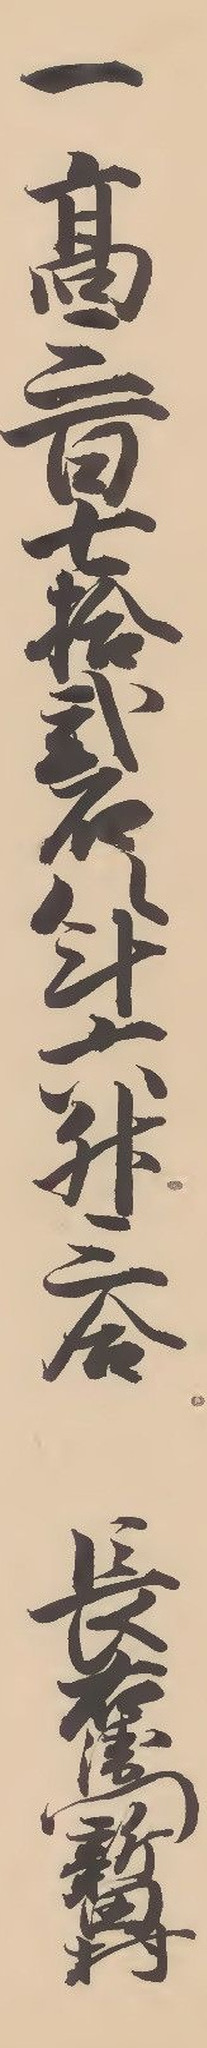一高三百七拾弐石八斗六升三合長右衛門新田村
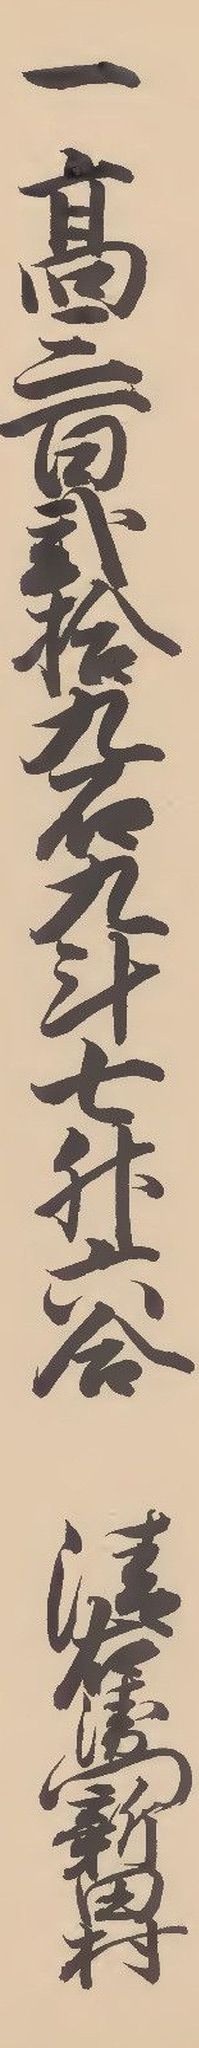一高三百弐拾九石九斗七升六合漬右衛門新田村
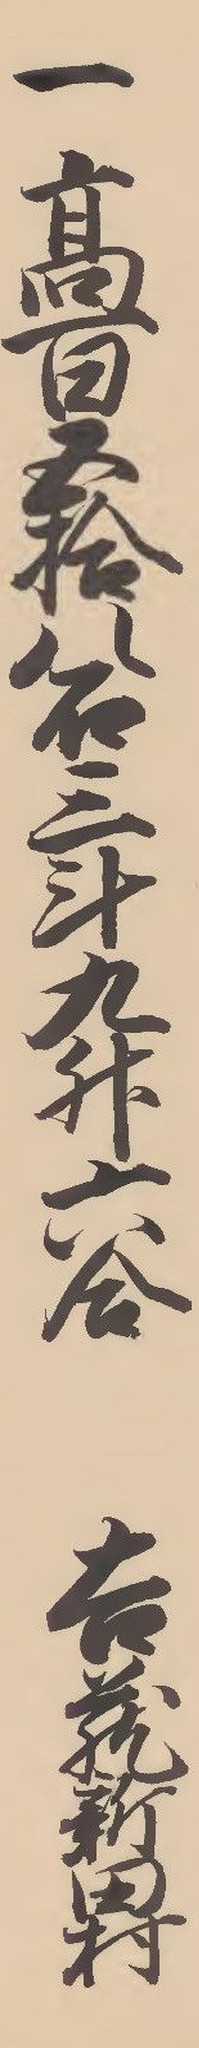一高百五拾八石三斗九升六合吉蔵新田村
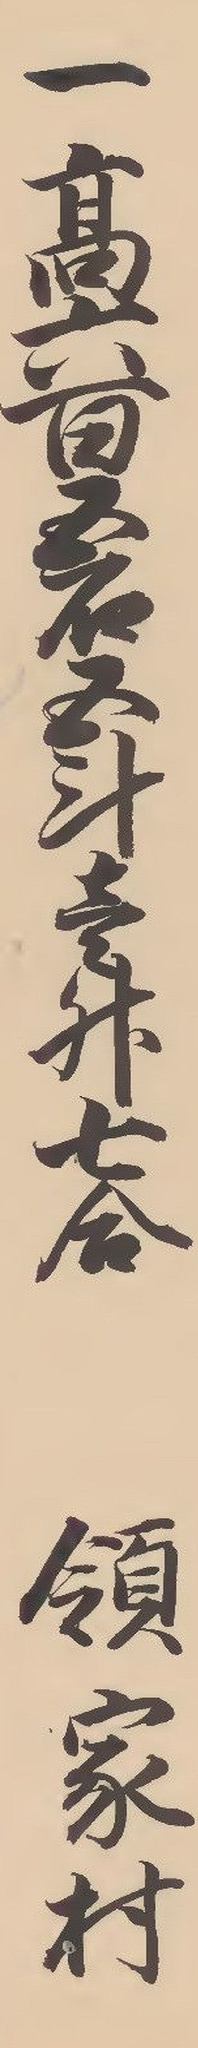一高六百五石五斗壱升七合領家村
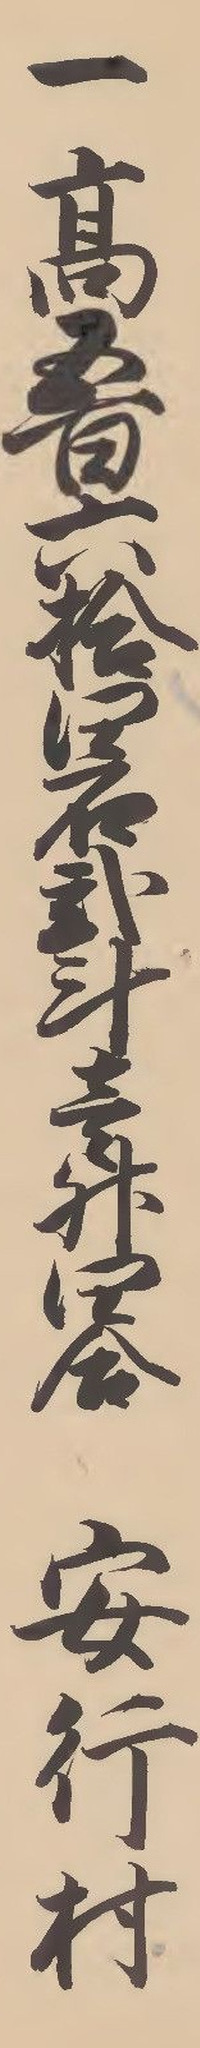一高五百六拾四弐斗壱升四合安行村
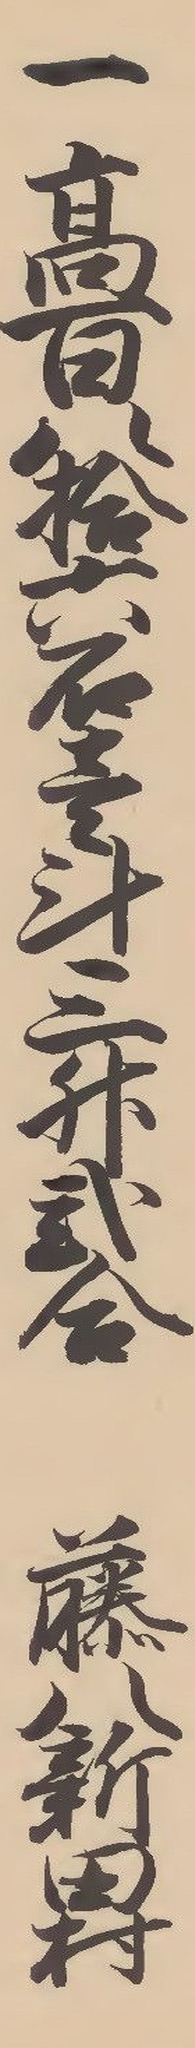一高百八拾六石壱斗三升弐合藤八新田村
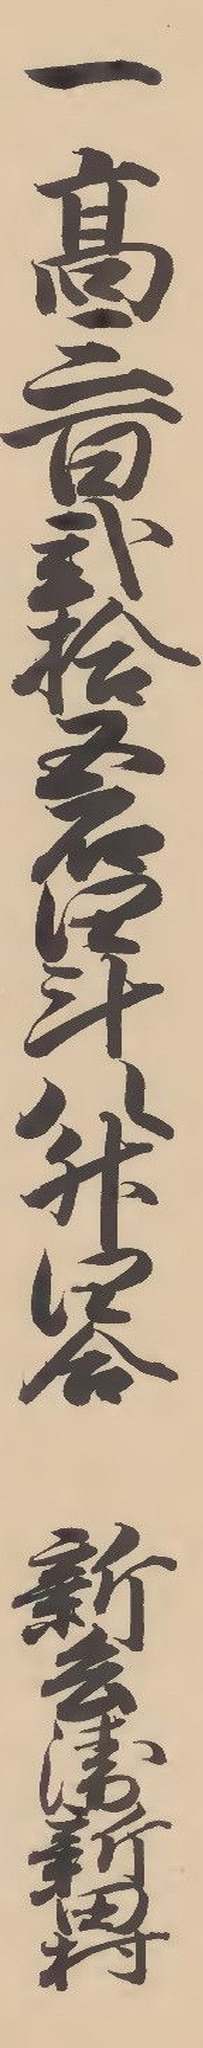一高三百弐拾五石四斗八升四合新兵衛新田村
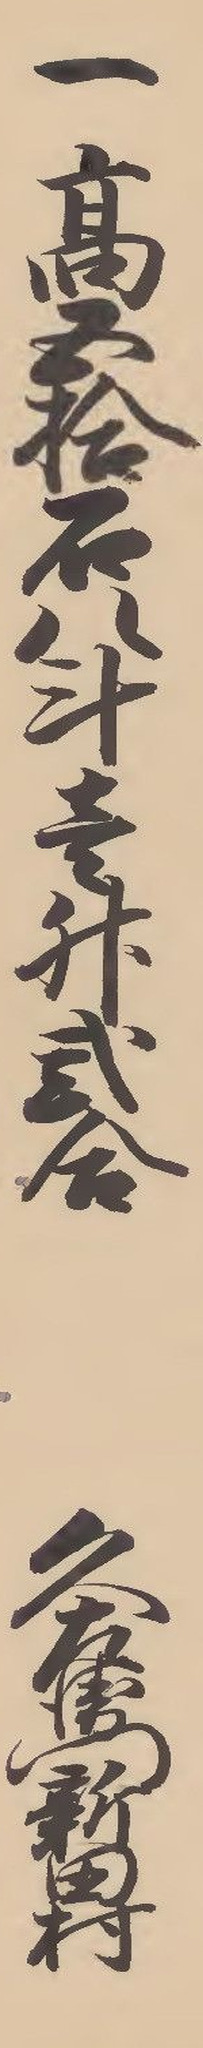一高五拾石八斗壱升弐合久左衛門新田村

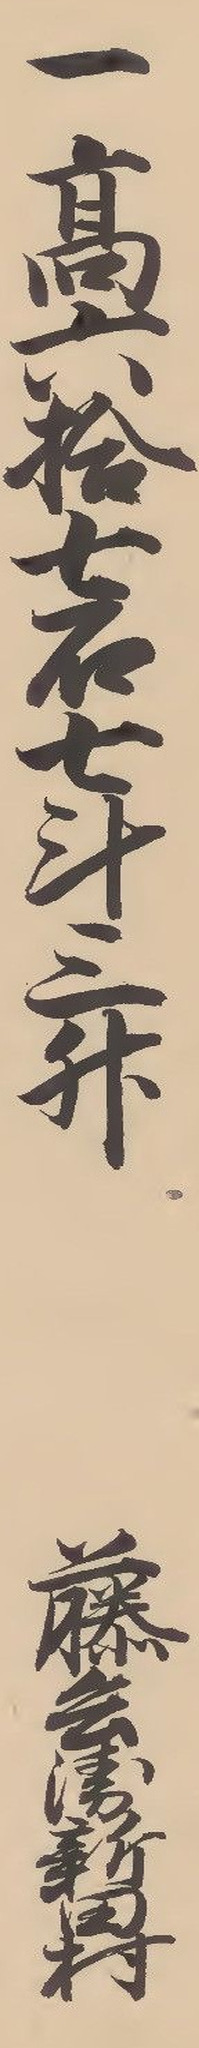一高六拾七石七斗三升藤兵衛新田村
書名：武蔵国郷帳　下
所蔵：国立公文書館 National Archives of Japan
